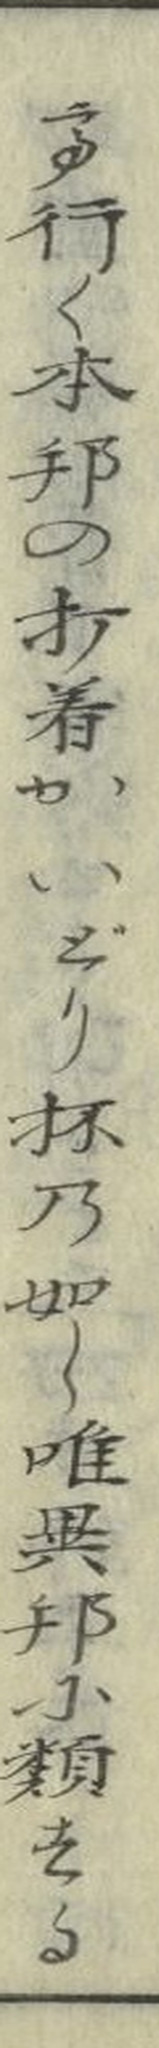て行く本邦の打着かいどり杯の如し唯異邦に類する
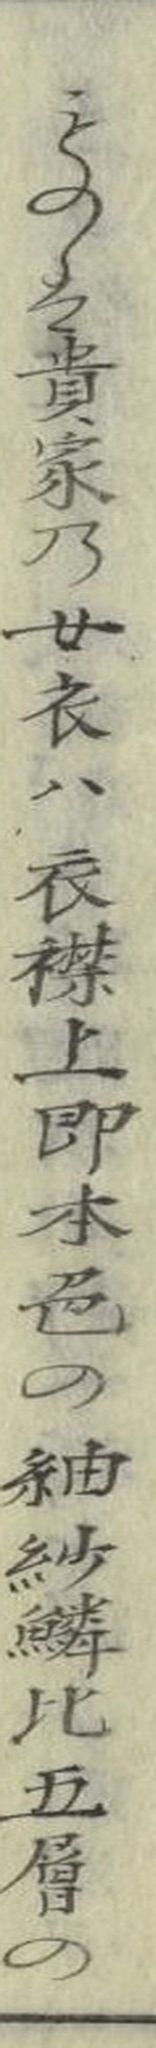ものは貴家の女衣は衣襟上即本色の紬紗鱗比五層の
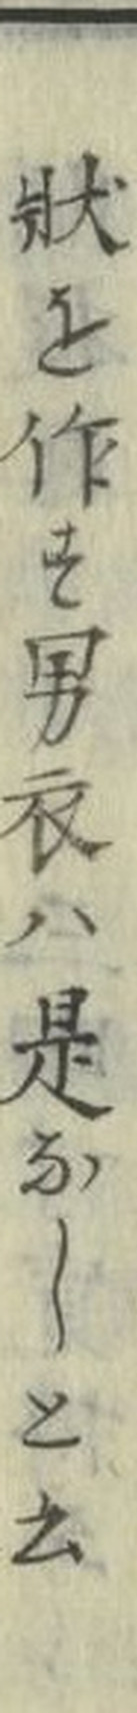状を作す男衣は是なしと云
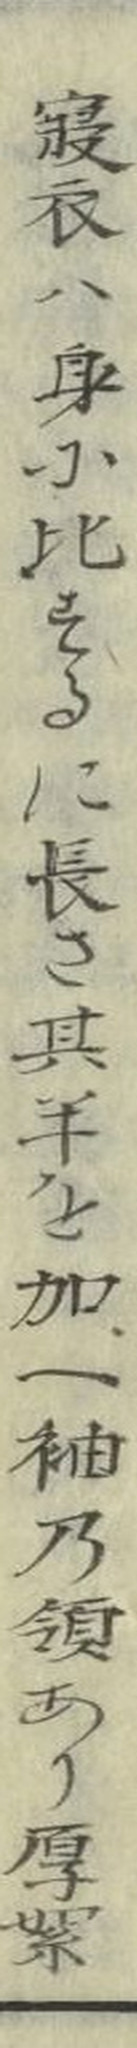寝衣は身に比するに長さ其半を加へ袖の領あり厚絮
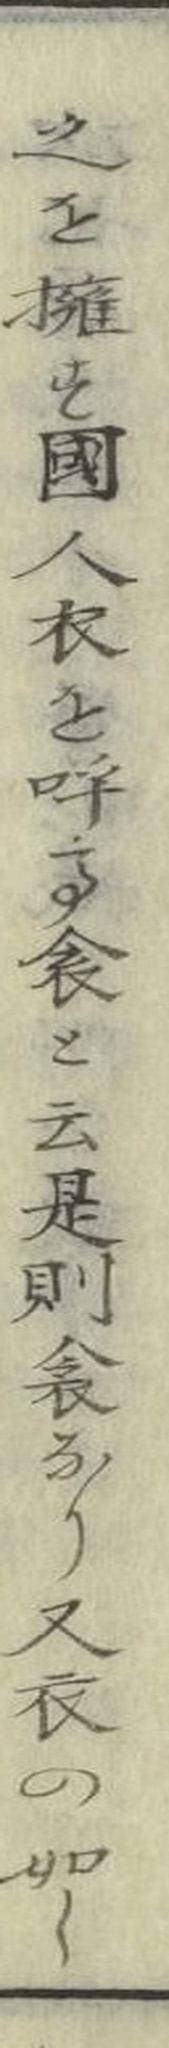之を擁す国人衣を呼て衾と云是則衾なり又衣の如し
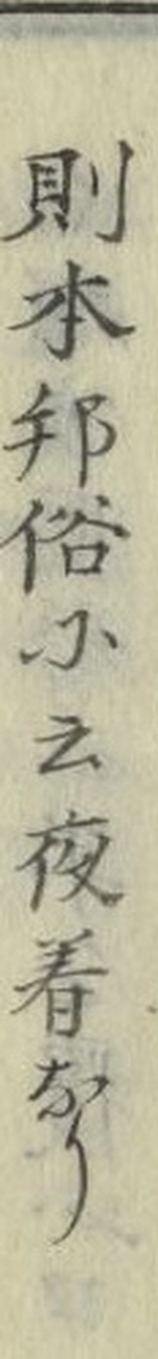則本邦俗に云夜着なり
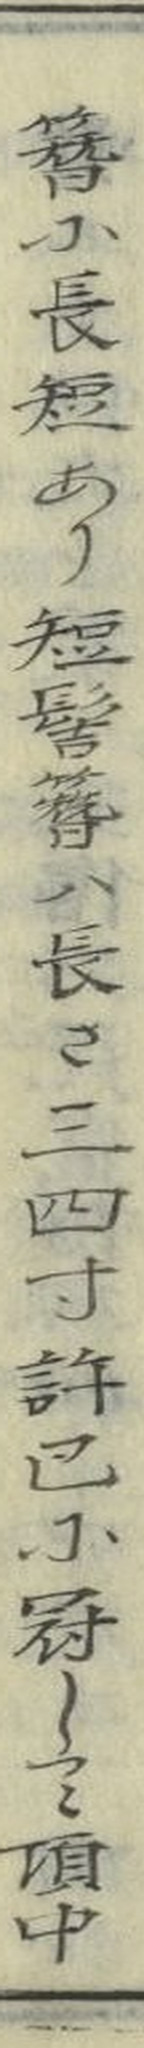簪に長短あり短髻簪は長さ三四寸許己に冠して頂中
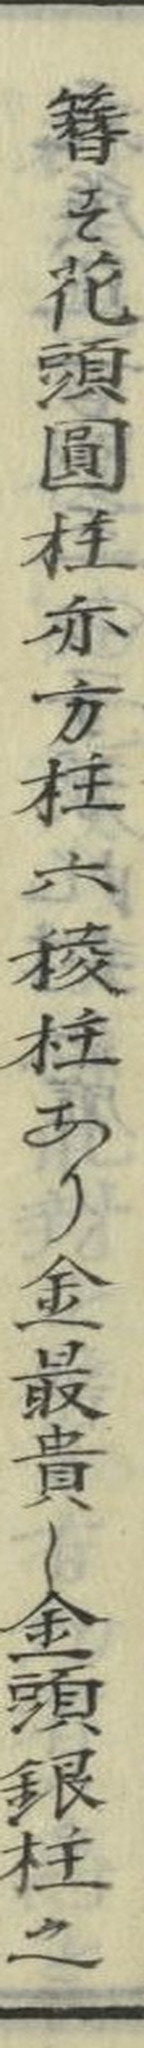簪す花頭円柱亦方柱六稜柱あり金最貴し金頭銀柱之
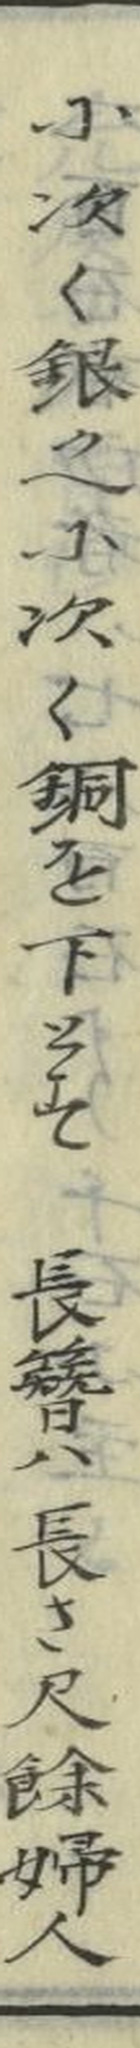に次く銀之に次く銅を下とす長簪は長さ尺餘婦人
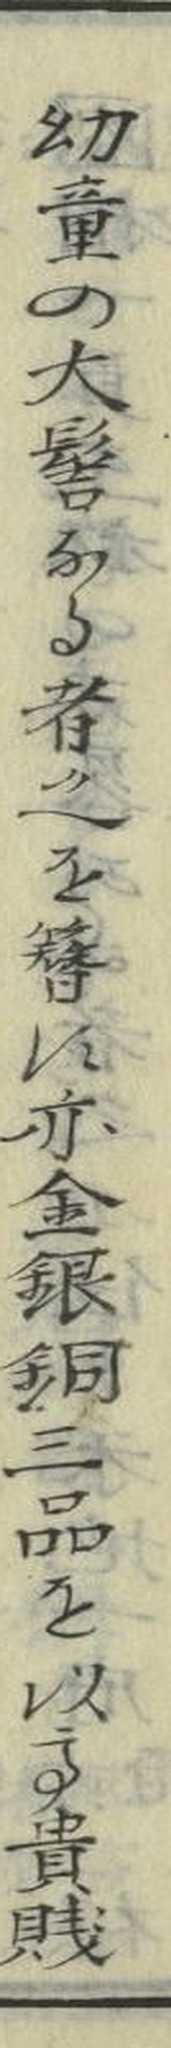幼童の大髻なる者之を簪す亦金銀銅三品を以て貴賤
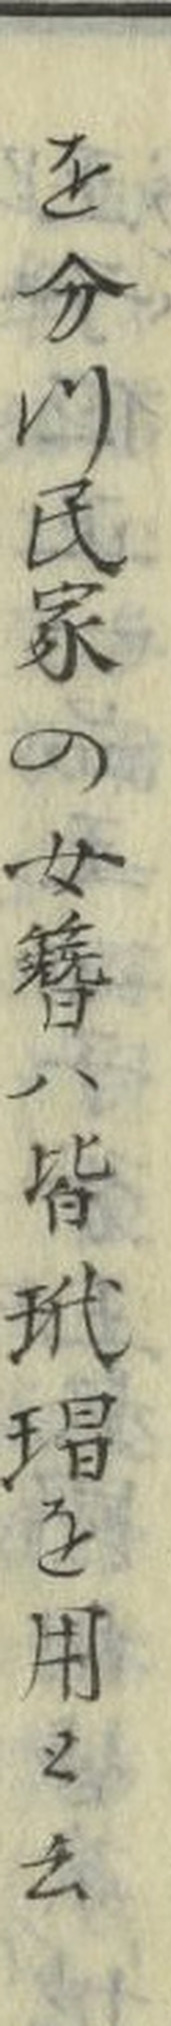を分つ民家の女簪は皆玳琩を用と云
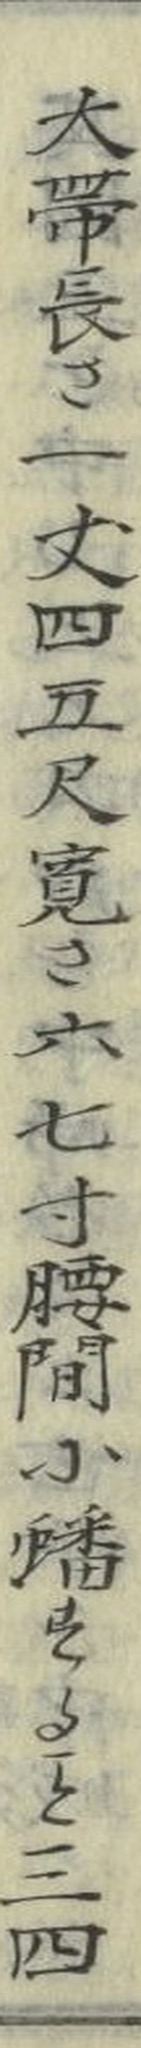大帯長さ一丈四五尺寛さ六七寸腰間に蟠すること三四
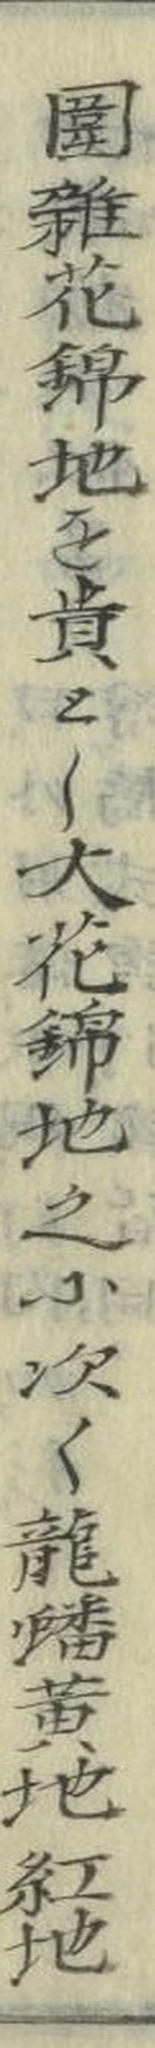囲雑花錦地を貴とし大花錦地之に次く龍蟠黄地紅地
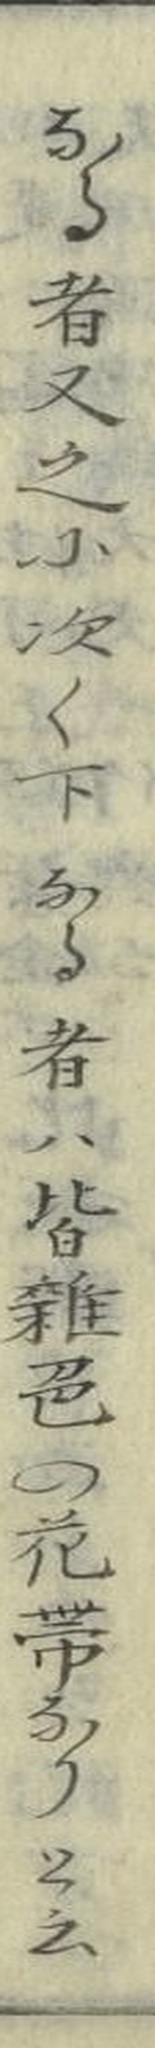なる者又之に次く下なる者は皆雑色の花帯なりと云
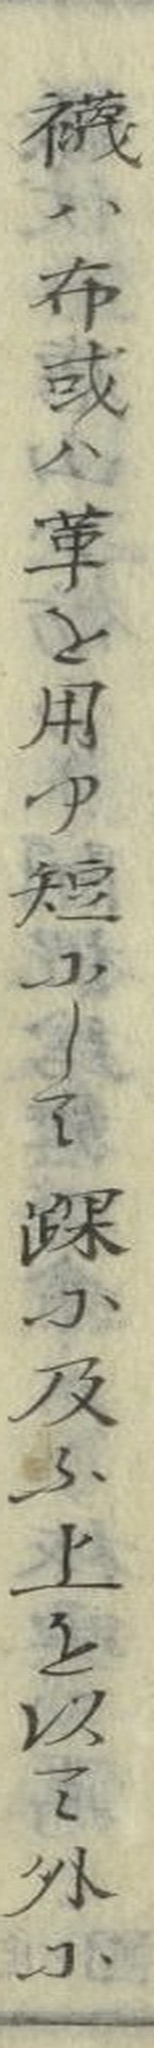襪は布或は革を用ゆ短にして踝に及ふ上を以て外に
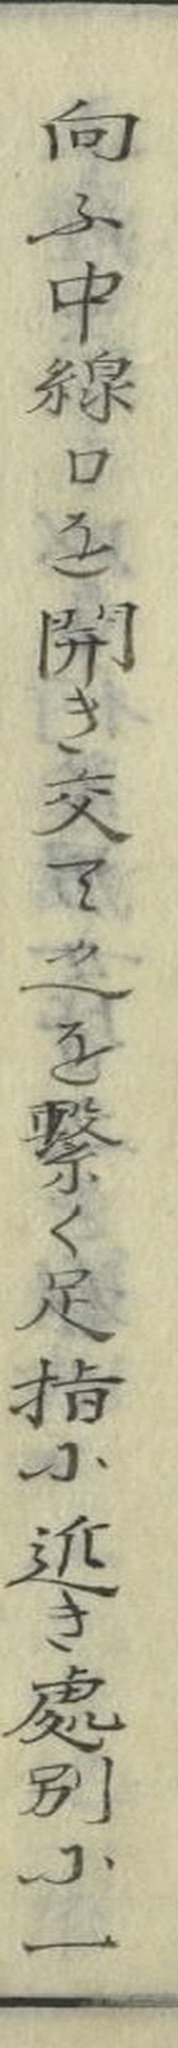向ふ中線口を開き交て之を繋く足指に近き処別に一
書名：琉球沿革志 上
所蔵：University of the Ryukyus Library
